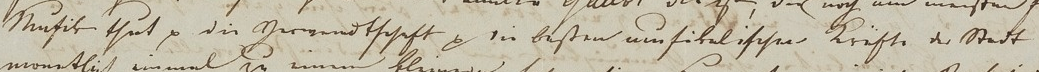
Musik thut & die Verwandtschaft & die besten musikalischen Kräfte der Stadt
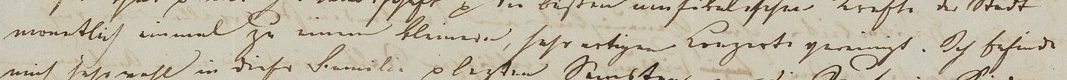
monatlich einmal zu einem kleinern, sehr artigen Conzerte vereinigt. Ich befinde
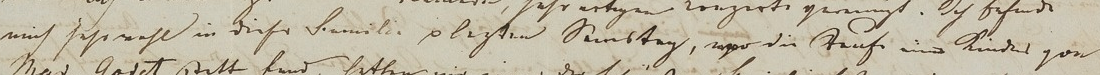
mich sehr wohl in dieser Familie & lezten Samstag, wo die Taufe eines Kindes von
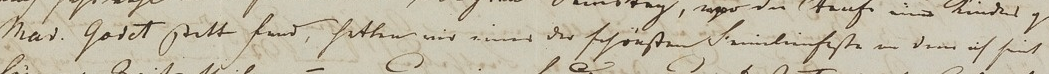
Mad. Godet statt fand, hatten wir eines der schönsten Familienfeste an dem ich seit
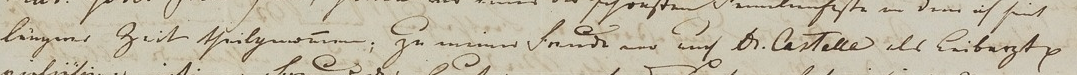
längerer Zeit theilgenommen; zu meiner Freude war auch Dr. Castella als Leibarzt &
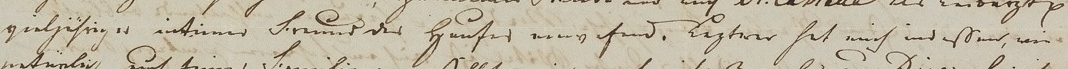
vieljähriger intimer Freund des Hauses anwesend. Lezterer hat mich indessen, wie
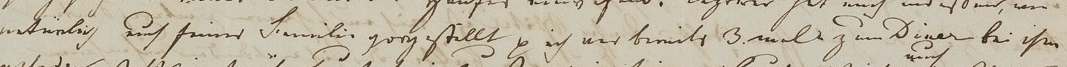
natürlich auch seiner Familie vorgestellt & ich war bereits 3. male zum Diner bei ihm
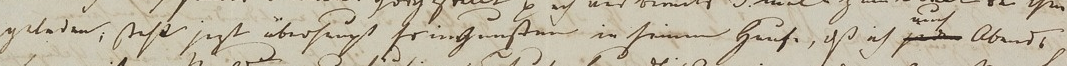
geladen; stehe jezt überhaupt so in Gunsten in seinem Hause, dß ich jedenauch Abends
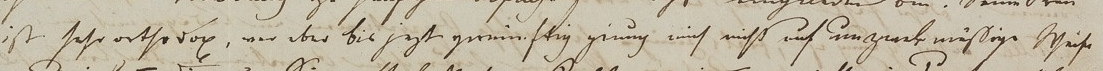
ist sehr orthodox, war aber bis jezt vernünftig genug mich nicht auf unzwekmässige Weise
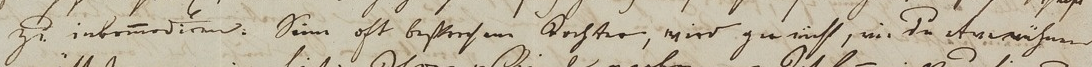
zu inkommodiren. Seine oft besprochene Tochter, wird gar nicht, wie du etwa wähnen
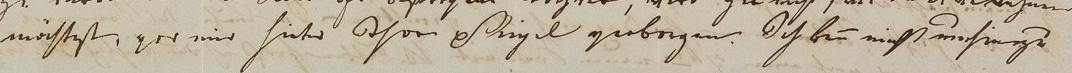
möchtest, vor mir hinter Thor & Riegel verborgen. Ich kann nicht umhin zu
